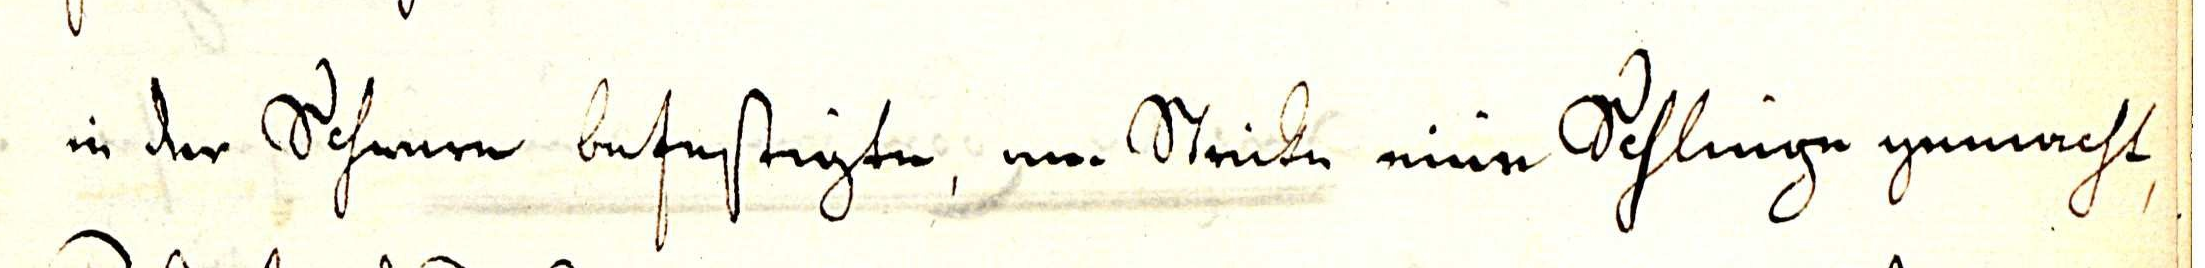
in der Schwure befestigte, am Stricke eine Schlinge gemacht,
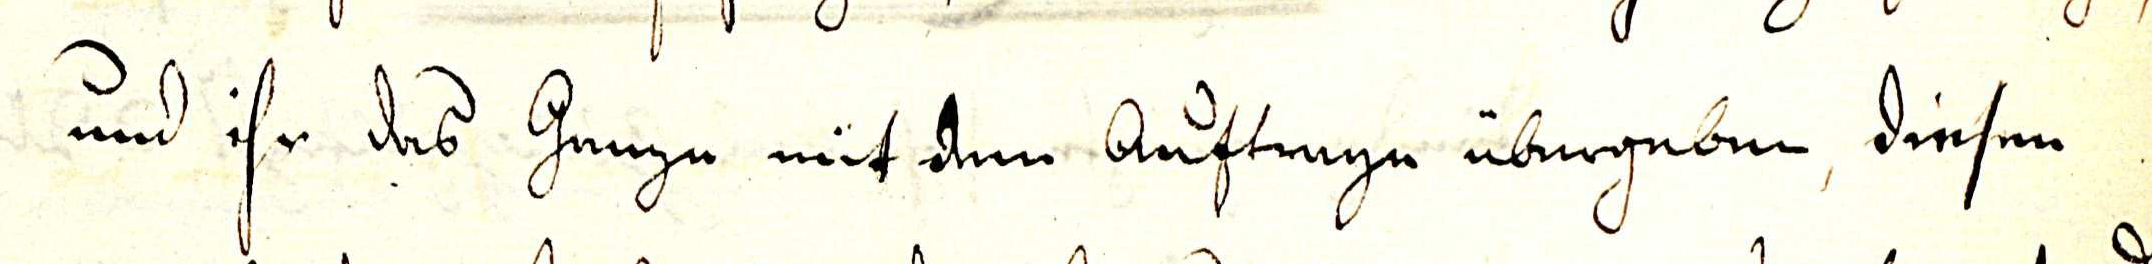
und ihr das Ganze mit dem Auftrage übergeben, diesen
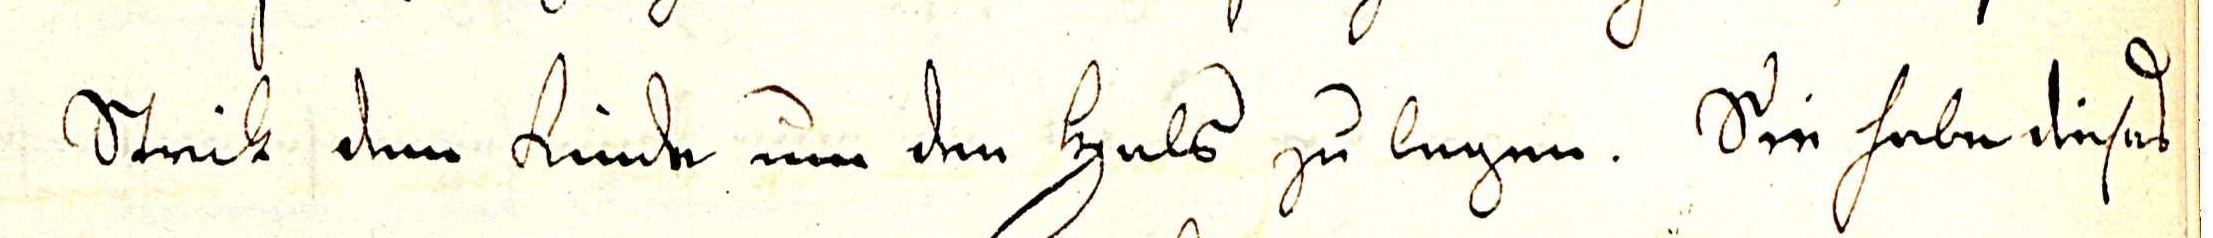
Strik dem Kinde um den Hals zu legen. Sie habe dieses
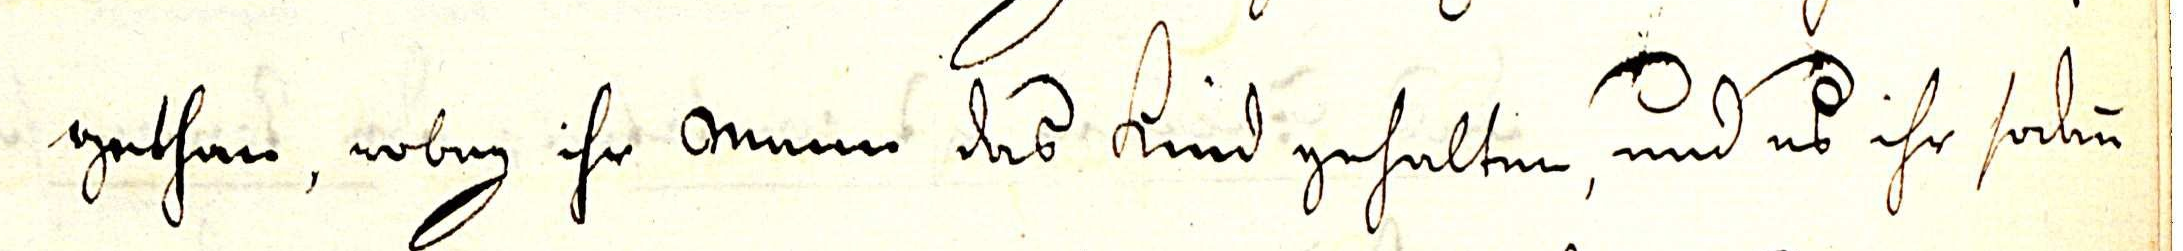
gethan, wobey ihr Mann das Kind gehalten und es ihr sodann
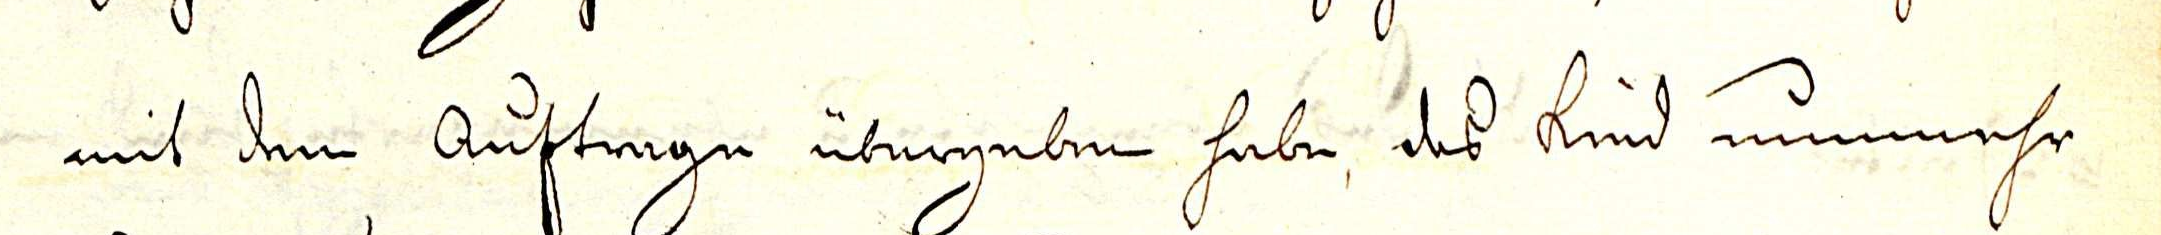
mit dem Auftrage übergeben habe, das Kind nunmehr
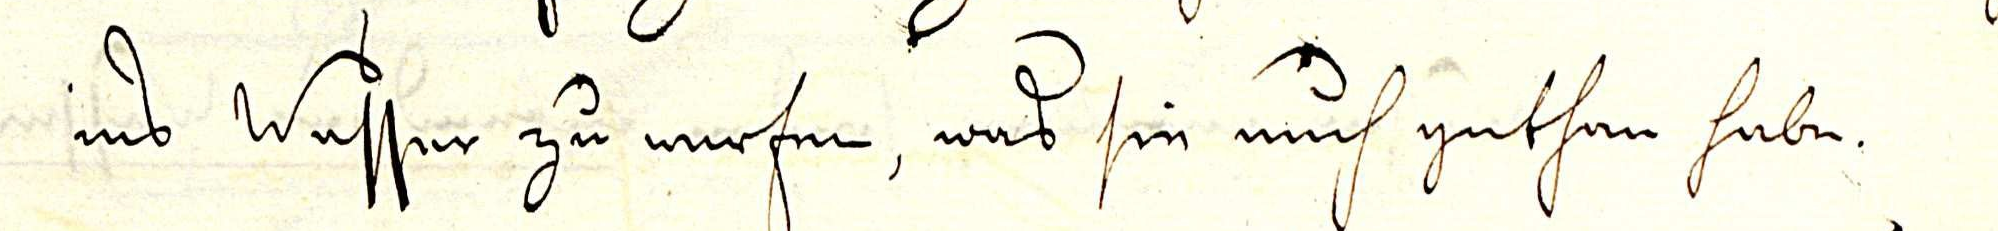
ins Wasser zu werfen, was sie auch gethan habe.
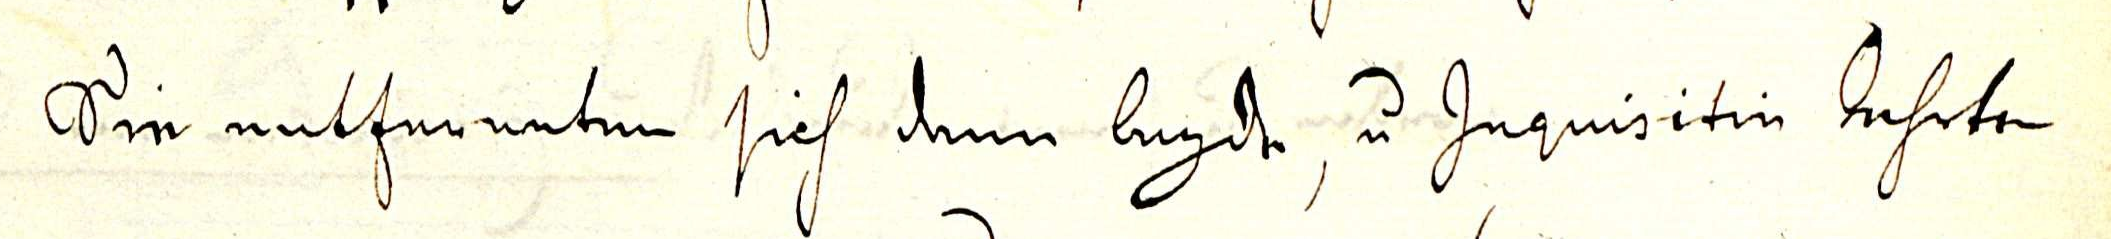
Sie entfernten sich dem [illeg. beyde?] u Inquisitin kehrte
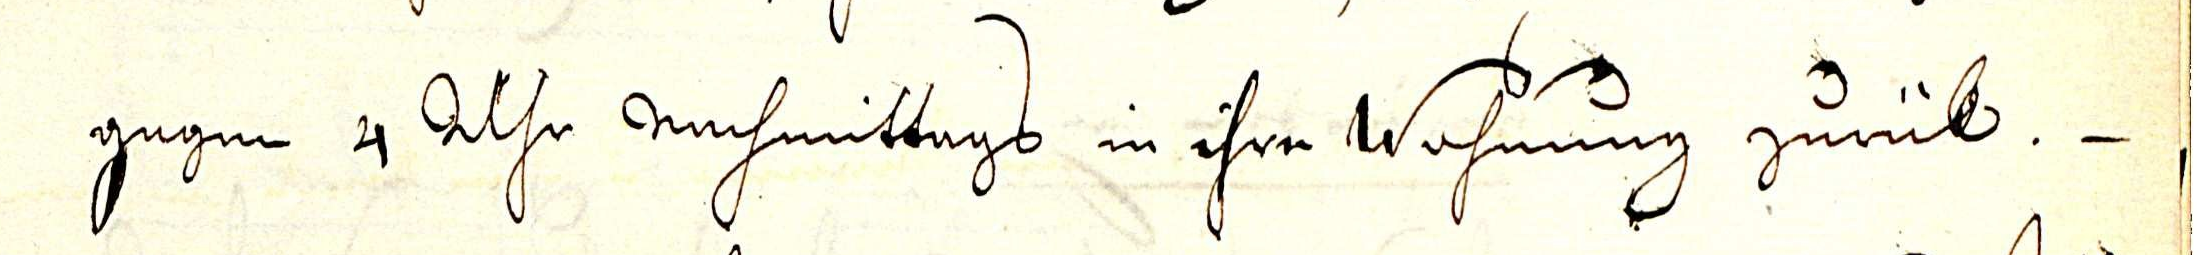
gegen 4 Uhr Nachmittags in ihre Wohnung zurück.
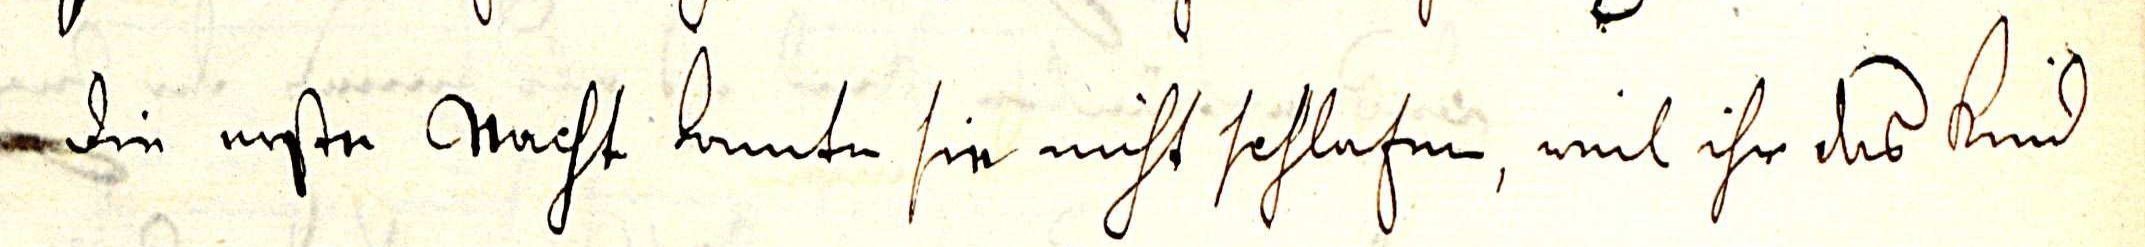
Die erste Nacht konnte sie nicht schlafen weil ihr das Kind
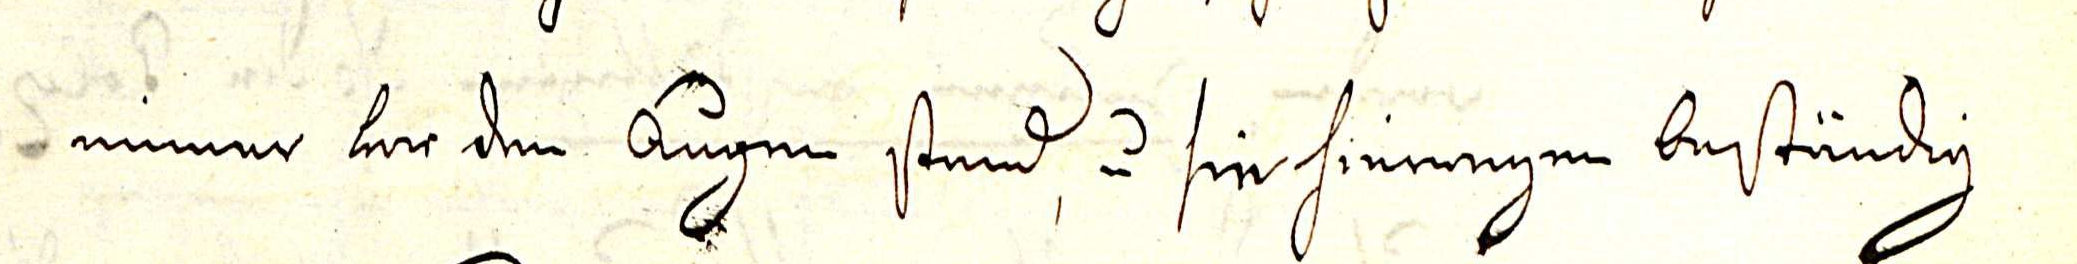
immer vor den Augen stand – sie hierwegen beständig
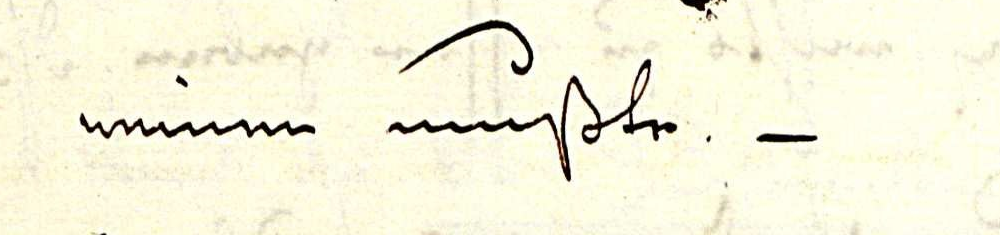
weinen mußte.
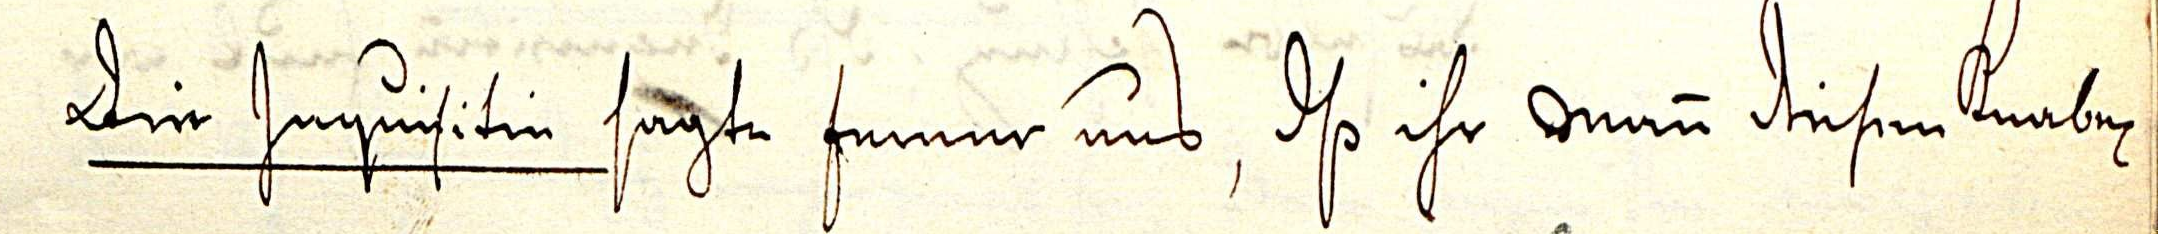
Die Inquisitin sagte ferner aus, daß ihr Mann diesen Knaben
